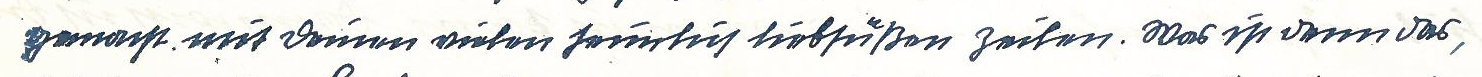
gemacht mit Deinen vielen heimlich liebsüßen Zeilen. Was ist denn das,
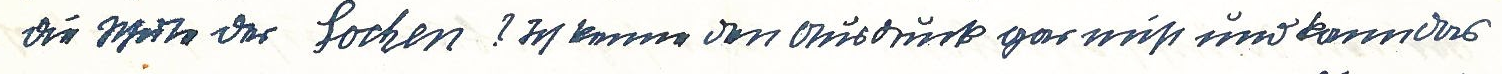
die Schule der Socken? Ich kenne den Ausdruck gar nicht und kann das
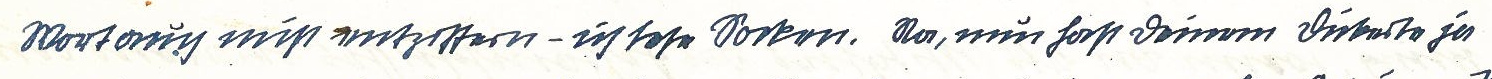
Wort auch nicht entziffern – ich lese Socken. Na, nun hast Deinem Dickerle ja
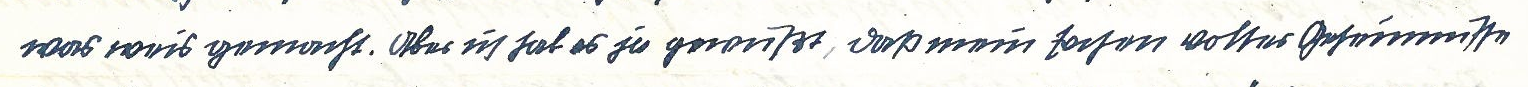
was weiß gemacht. Aber ich hab es ja gewußt, daß mein Evchen voller Geheimnisse
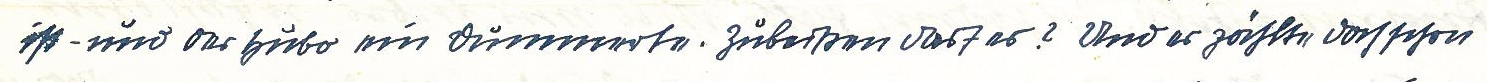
ist – und der Hubo ein Dummerle. Zubeißen darf er? Und er zählte doch schon
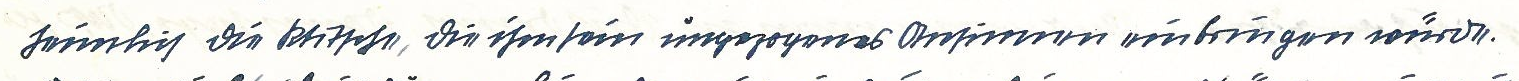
heimlich die Klitsche, die ihm sein ungezogenes Ansinnen einbringen würde.
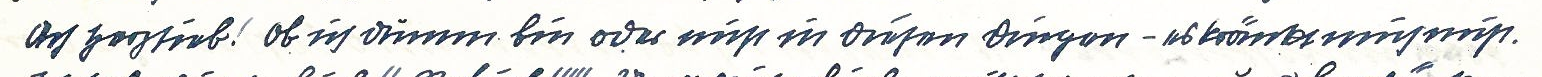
Ach Herzlieb! ob ich dumm bin oder nicht in diesen Dingen – es kränkt mich nicht.
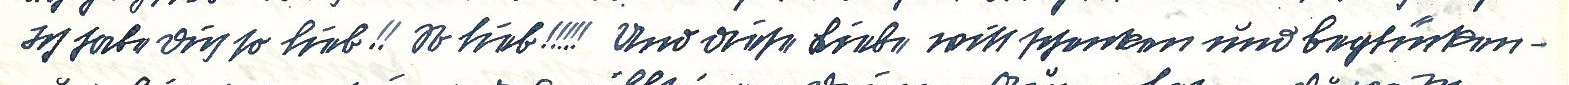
Ich habe Dich so lieb!! So lieb!!!!! Und diese Liebe will schenken und beglücken –
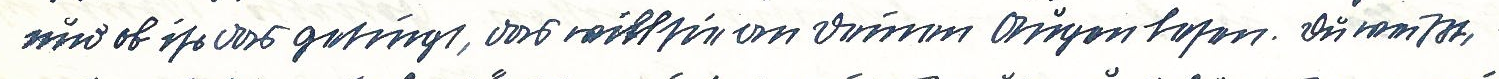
und ob ihr das gelingt, das will sie an Deinen Augen sehen; Du weißt,
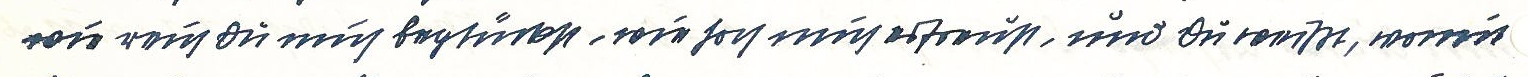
wie reich Du mich beglückst, wie hoch mich erfreust, und Du weißt, womit
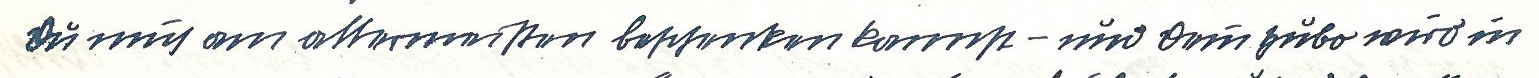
Du mich am allermeisten beschenken kannst – und Dein Hubo wird in
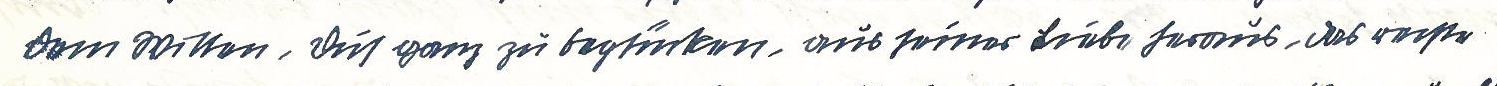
dem Willen, Dich ganz zu beglücken, aus seiner Liebe heraus, das rechte
